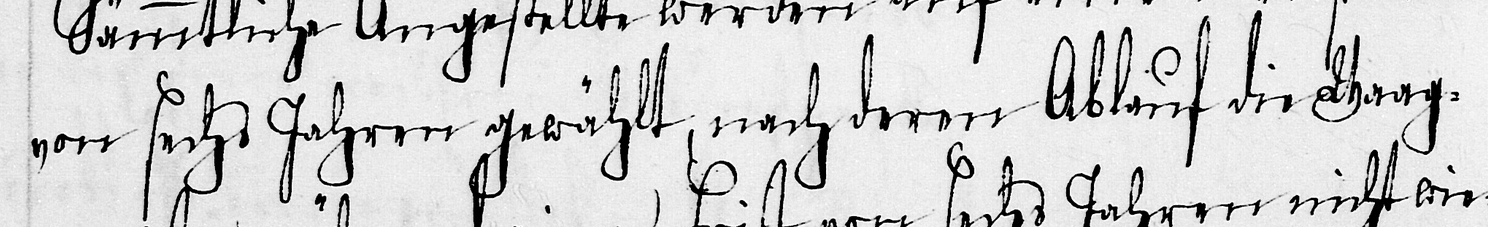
von sechs Jahren gewählt, nach deren Ablauf die Waag¬
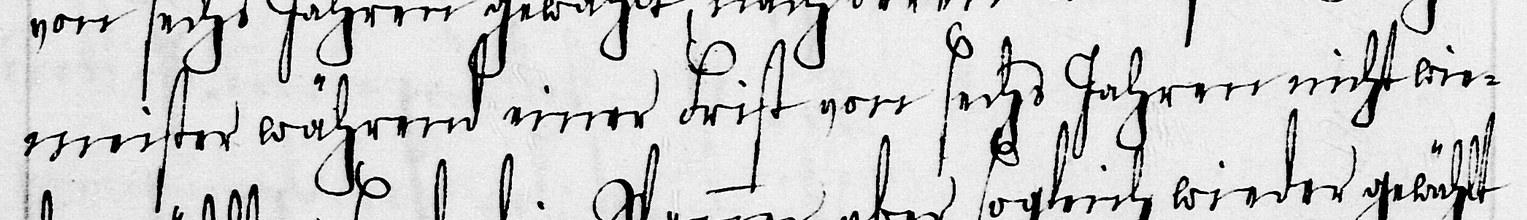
meister während einer Frist von sechs Jahren nicht wie¬
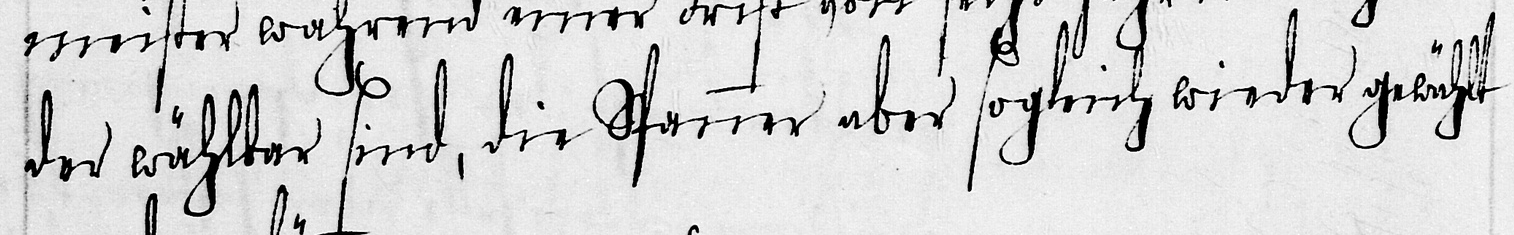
der wählbar sind, die Spanner aber sogleich wieder gewäh¬
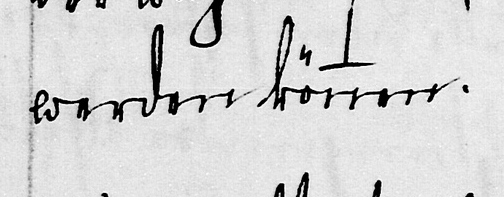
werden können.
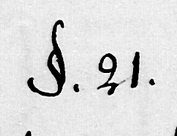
§. 21.
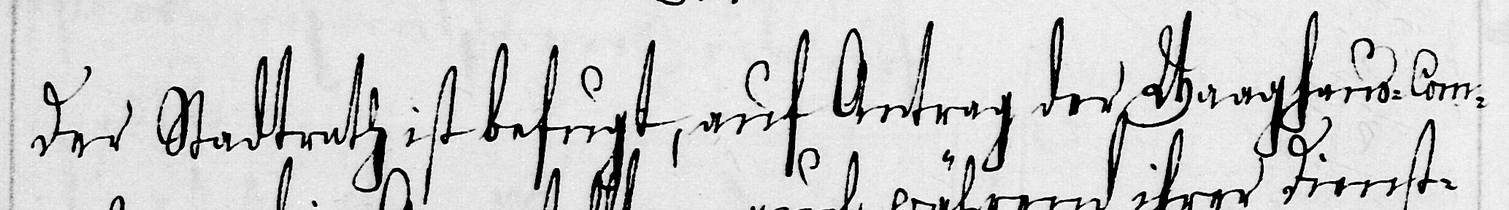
Der Stadtrath ist befugt, auf Antrag der Waaghaus-Co¬
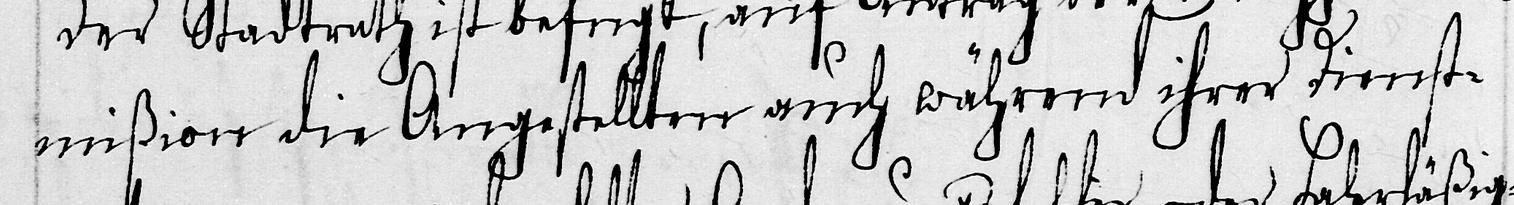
mmißion die Angestellten auch während ihrer Dienst¬
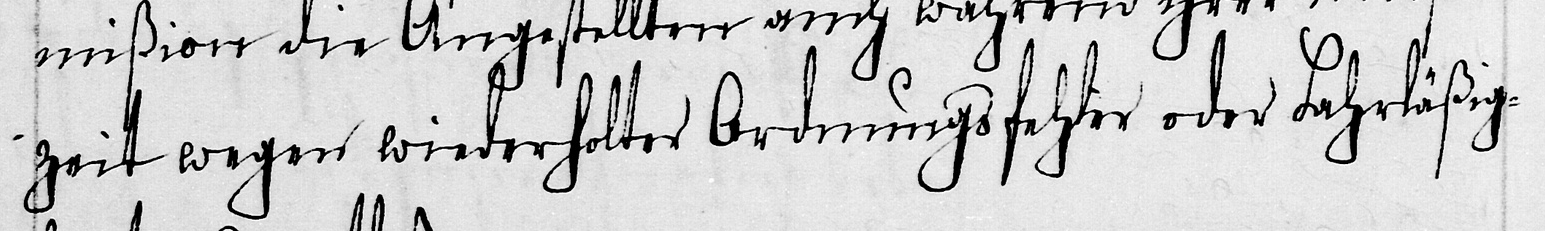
zeit wegen wiederholter Ordnungsfehler oder Fahrläßig¬
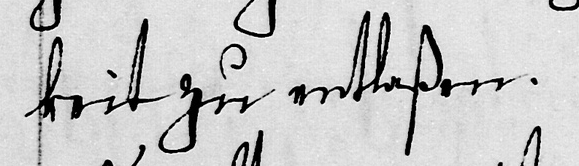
keit zu entlaßen.
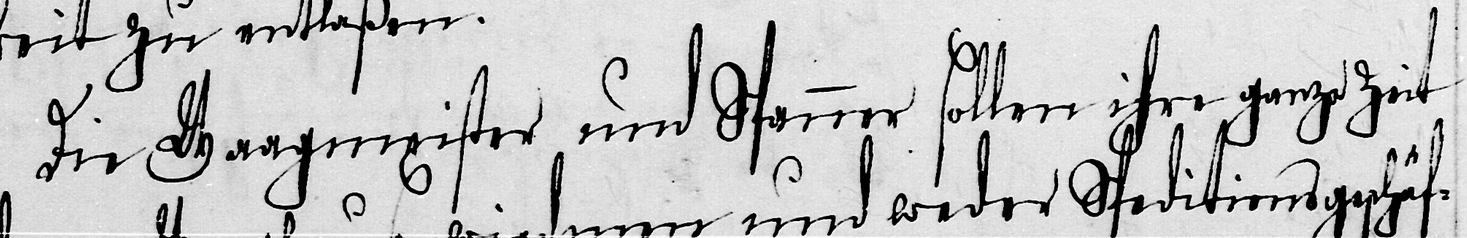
Die Waagmeister und Spanner sollen ihre ganze
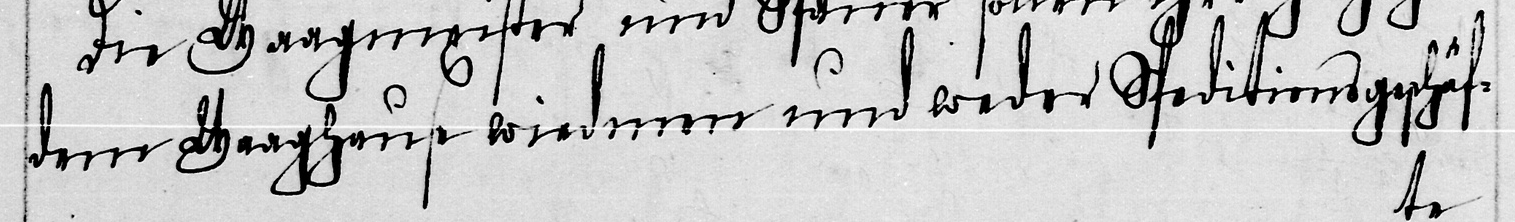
dem Waaghause wiedmen und weder Speditionsgeschäf-
